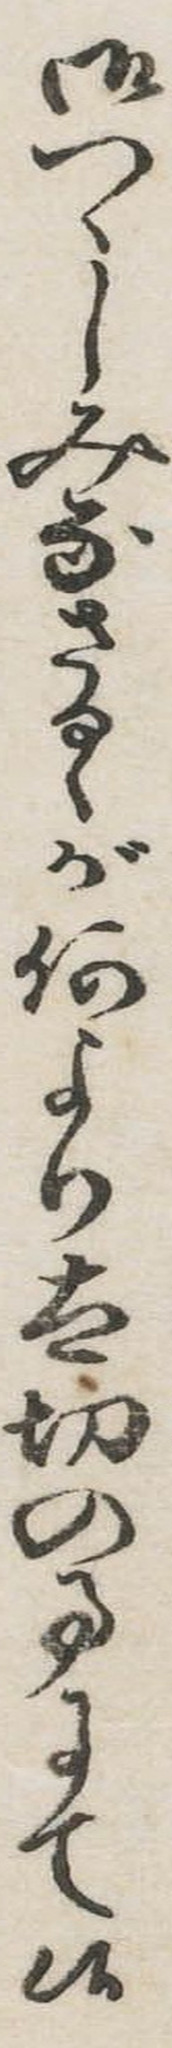御つゝしみなさるゝが何より大切の事にて候
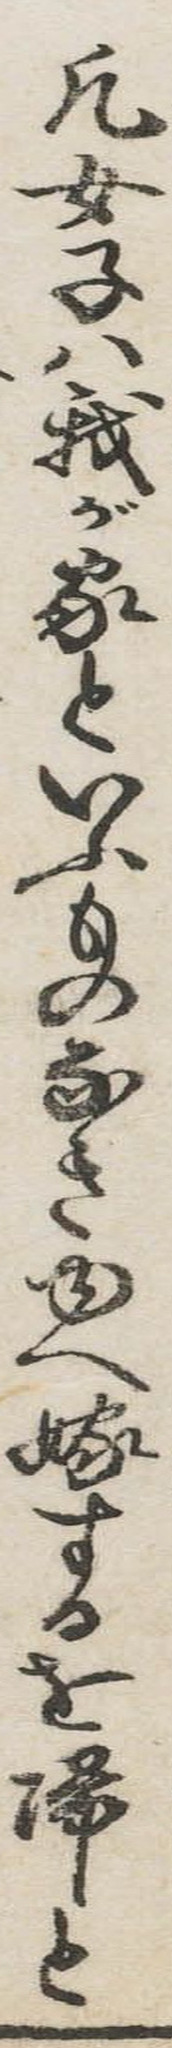凡女子は我が家といふものなきゆへ嫁するを帰と
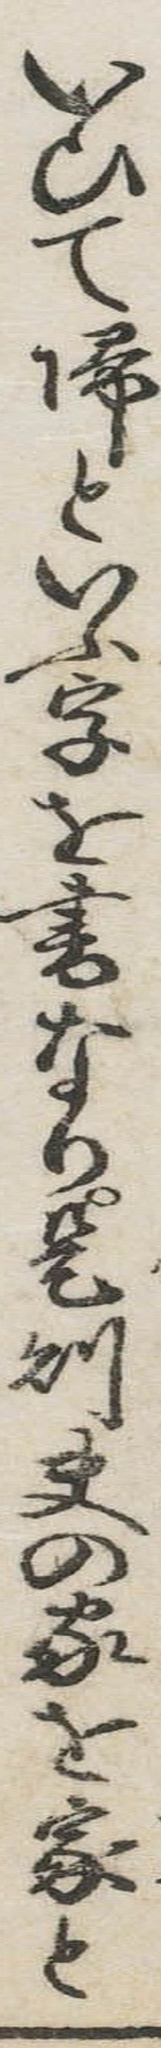いひて帰といふ字を書なり。是則夫の家を家と
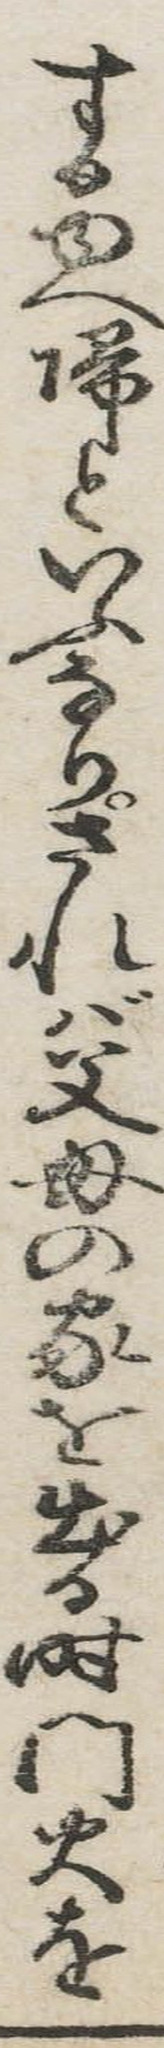するゆへ帰といふなり。されば父母の家を出る時門火を
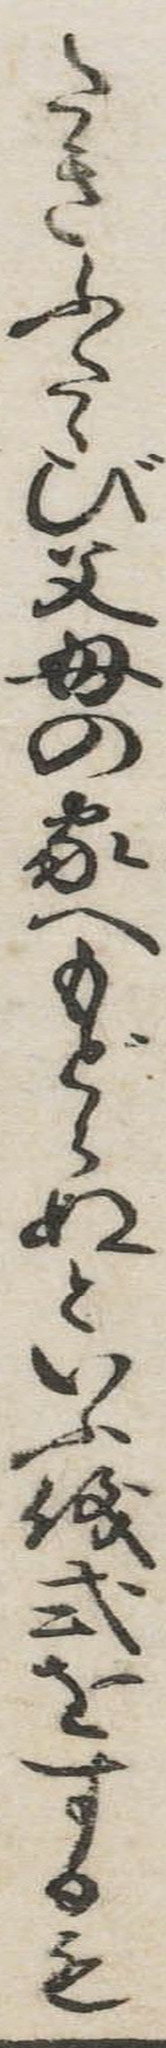たきふたゝび父母の家へもどらぬといふ儀式をするも
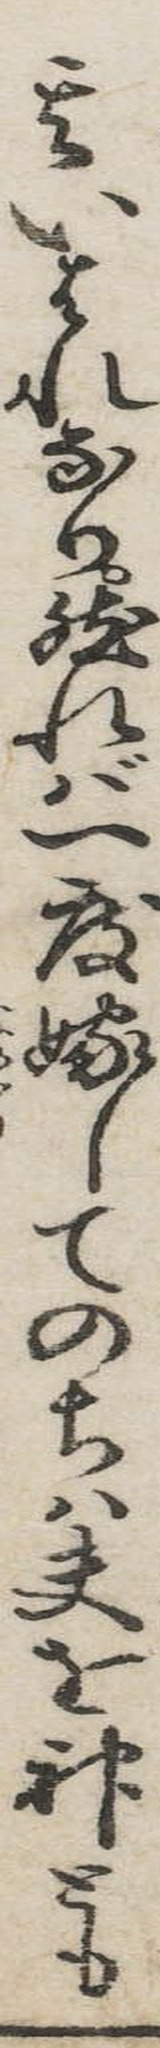其いはれなり。然れば一度嫁してのちは夫を神とも
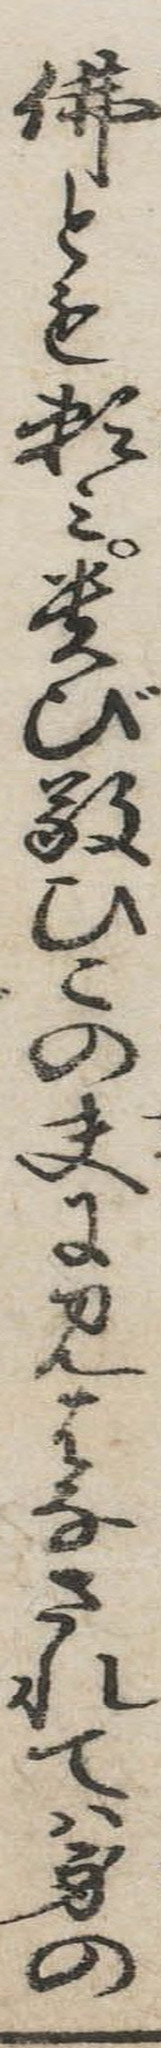仏とも頼み。貴び敬ひこの夫に見はなされては身の
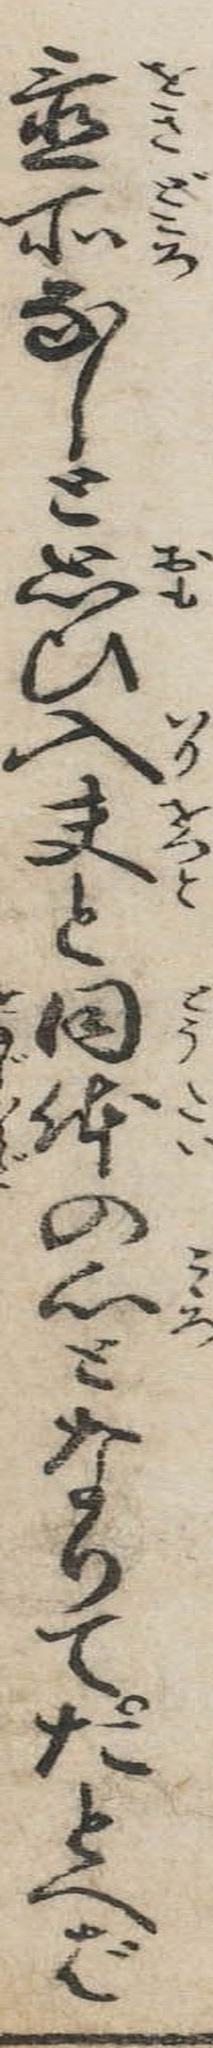置所なしと思ひ入夫と同体の心となりて。たとへば

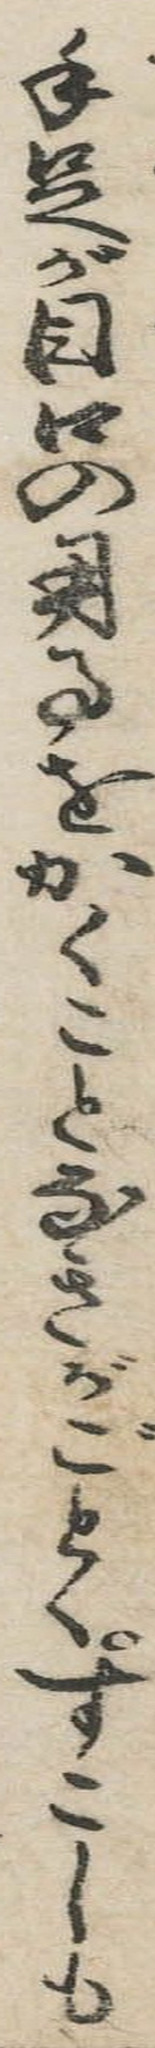手足が目口の用事をかくことなきがごとく。すこしも
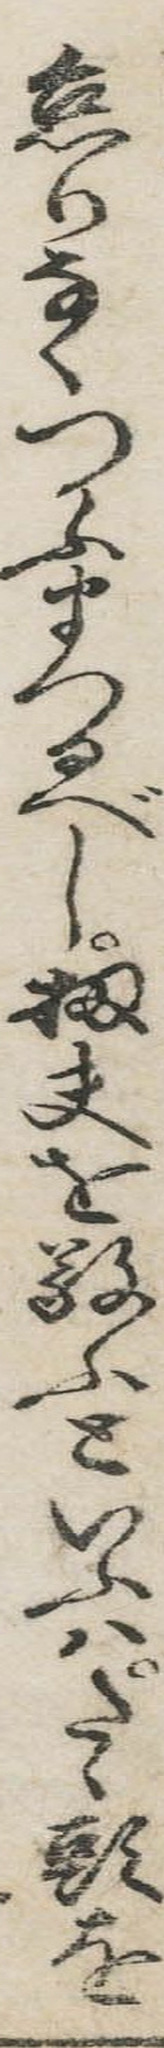怠りなくつかふまつるべし。扨夫を敬ふといふは。たゝ頭を
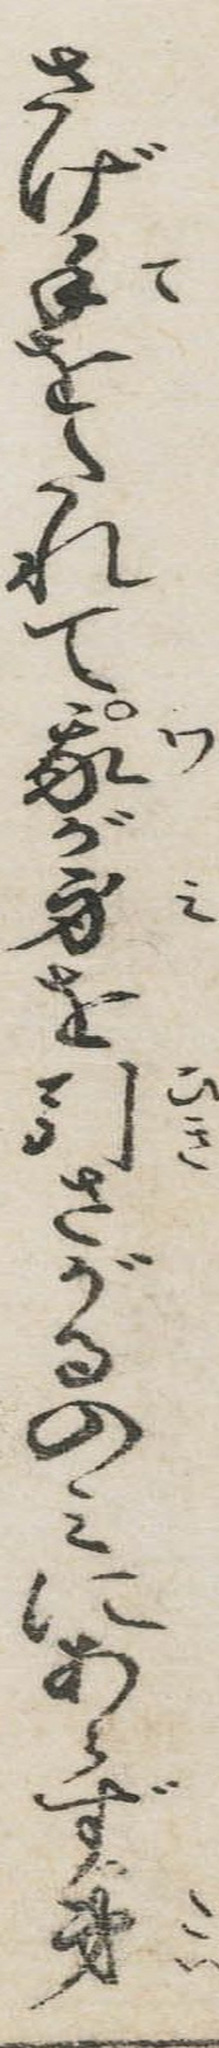さげ手をたれて。我が身を引さがるのみにあらず。第
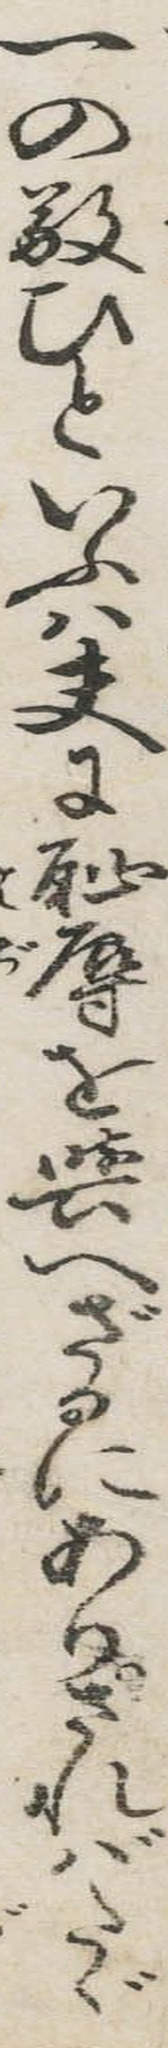一の敬ひといふは夫に恥辱を与へざるにあり。さればたゞ
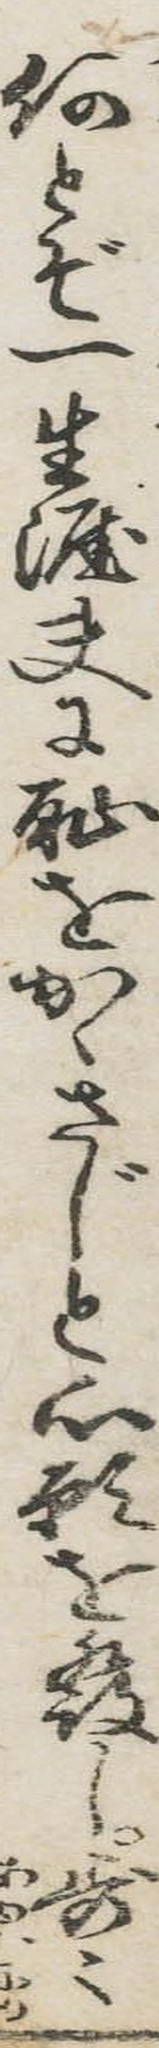何とぞ一生涯夫には恥をかゝさじと心願を発し。歩々
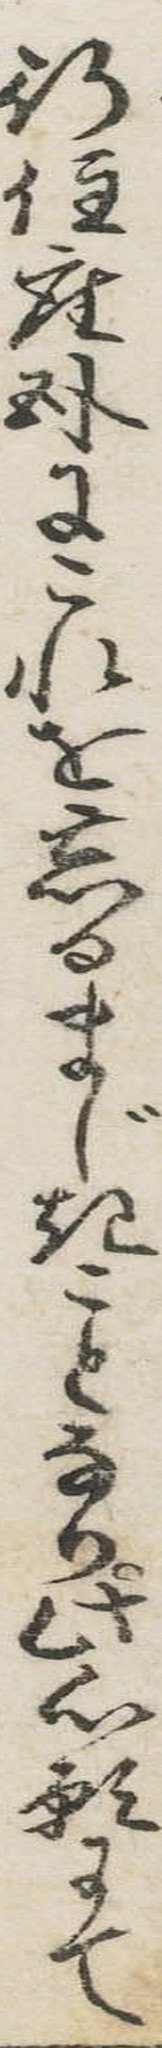行住座臥にこれを忘るまじきことなり。此心願にて
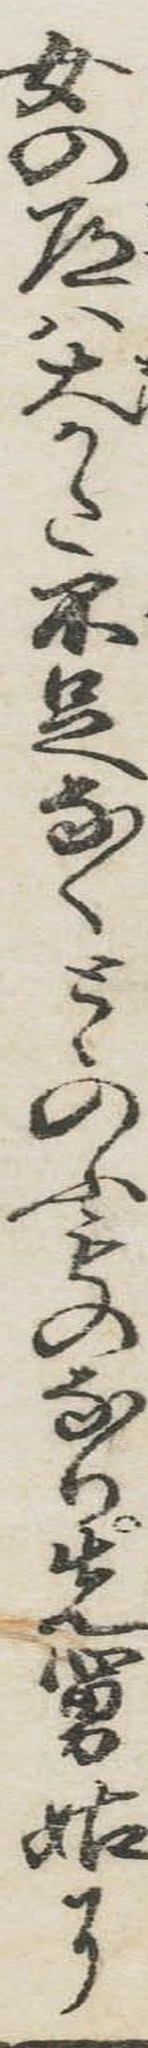女の道は大かた不足なくとゝのふものなり。先舅姑に
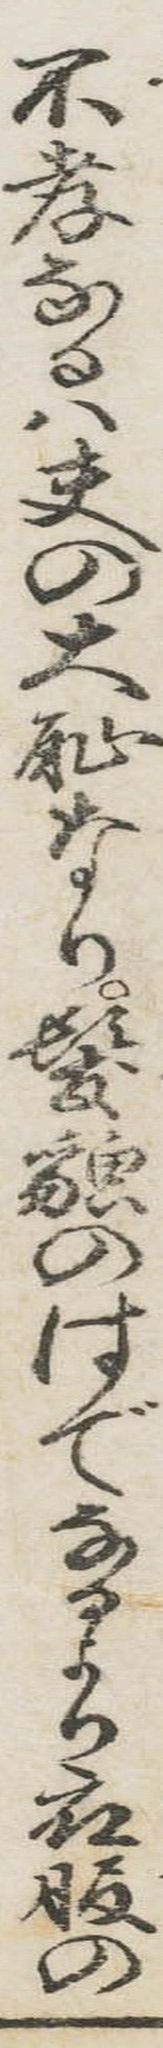不孝なるは夫の大恥なり。髪貌のはでなるより衣服の
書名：前訓
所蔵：東京学芸大学附属図書館
